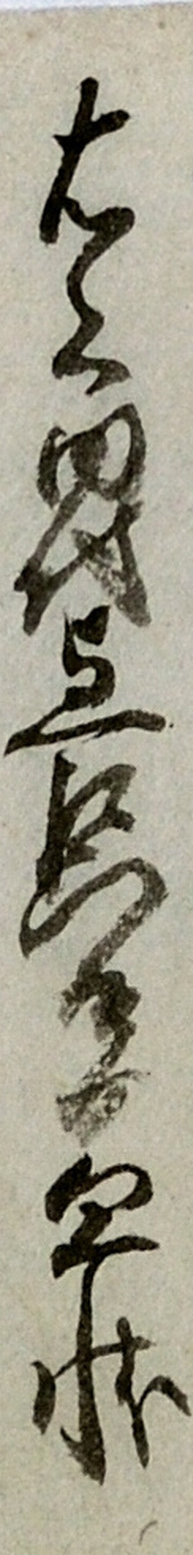右は田村与左衛門殿ゟ廻状
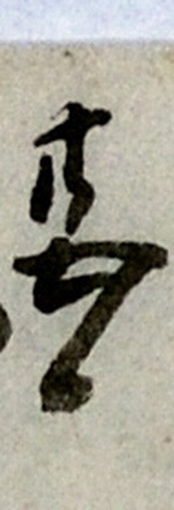廿五日
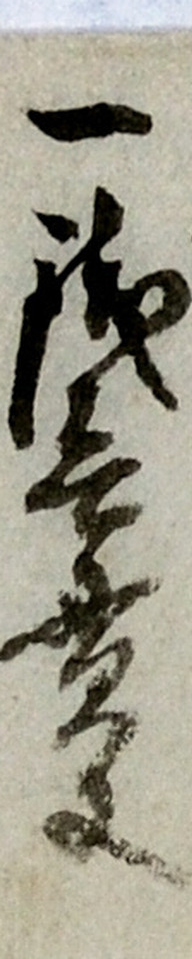一銭壱貫文
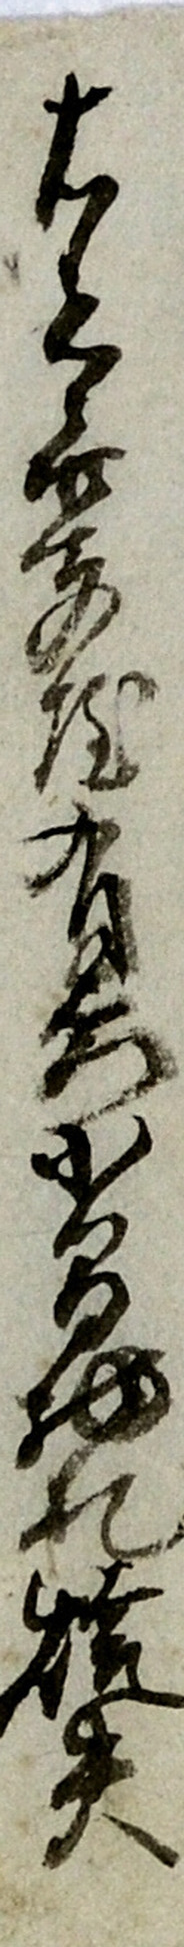右は喜多屋有右衛門小間物札焼失
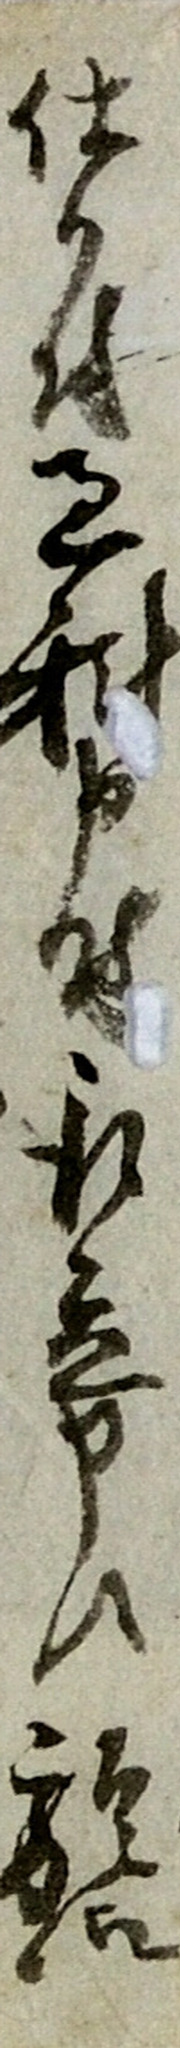仕候付過料申付取立申候於御
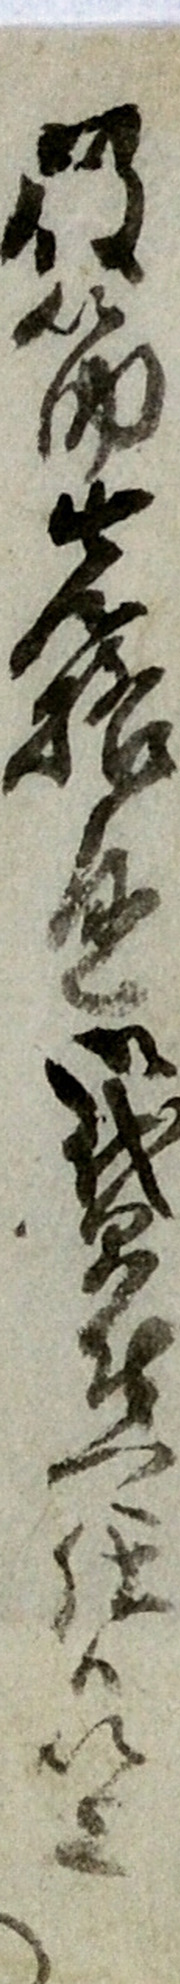役筋先格通御貸付可仕候以上
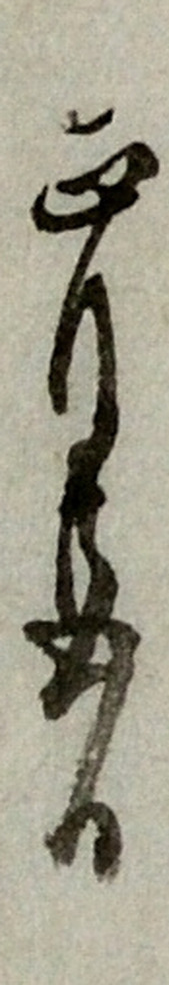正月廿三日
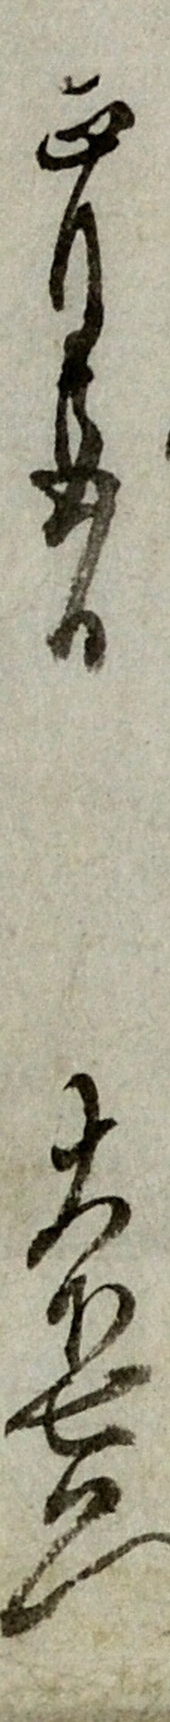正月廿五日大下七左衛門
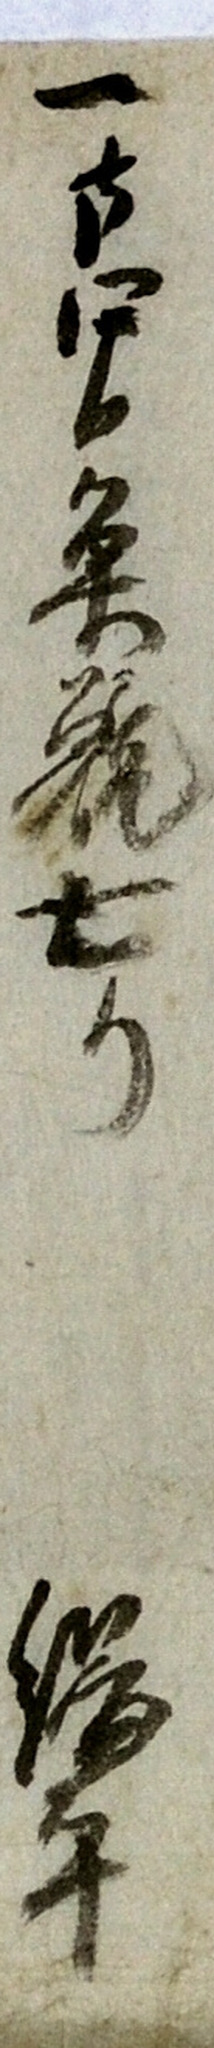一廿四日魚鯇七つ総平
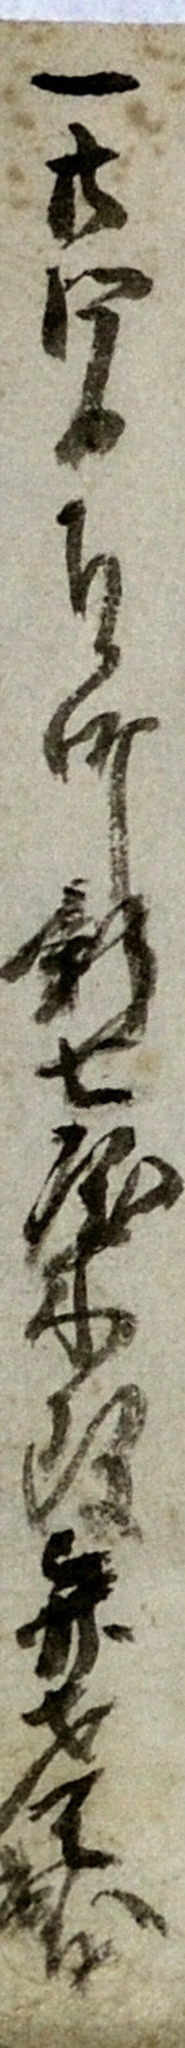一廿四日下り町新七屋木改弁才天へ出ス
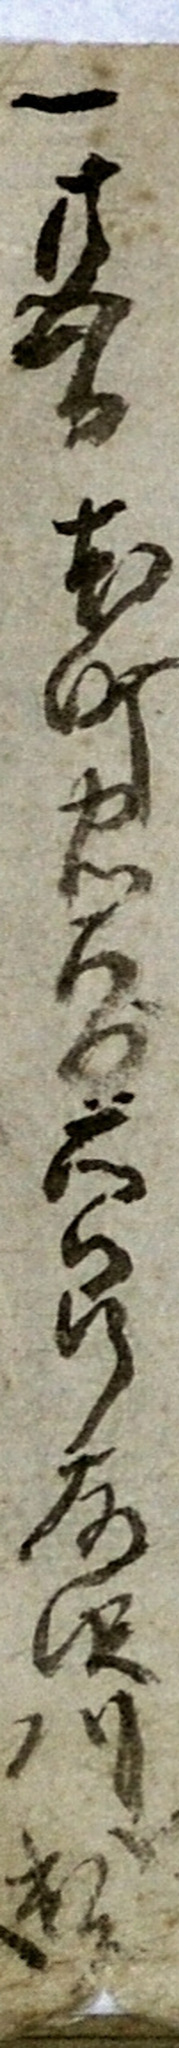一廿五日本町忠右衛門右同断藤沢川へ出ス

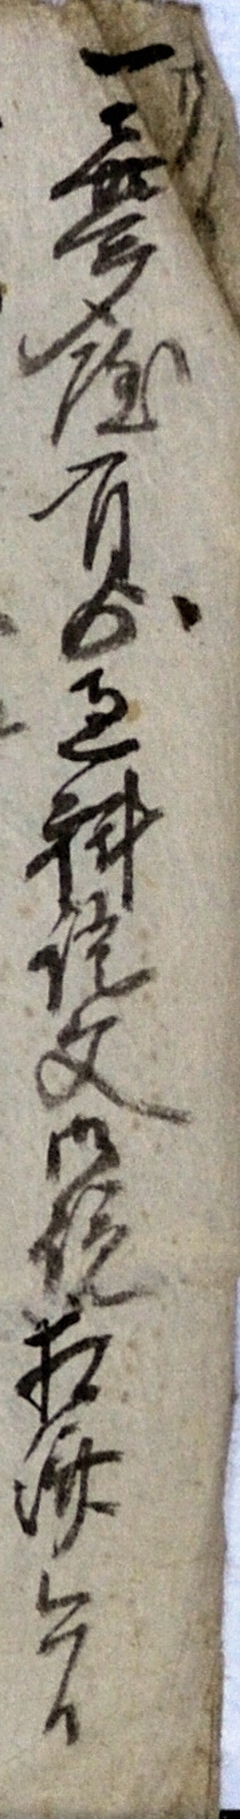一喜多屋有右衛門過料証文御覧相済今日
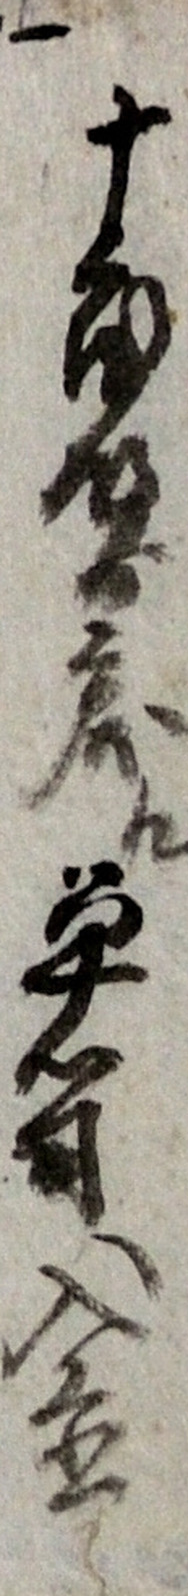十蔵殿ゟ戻ル箪笥へ入置候
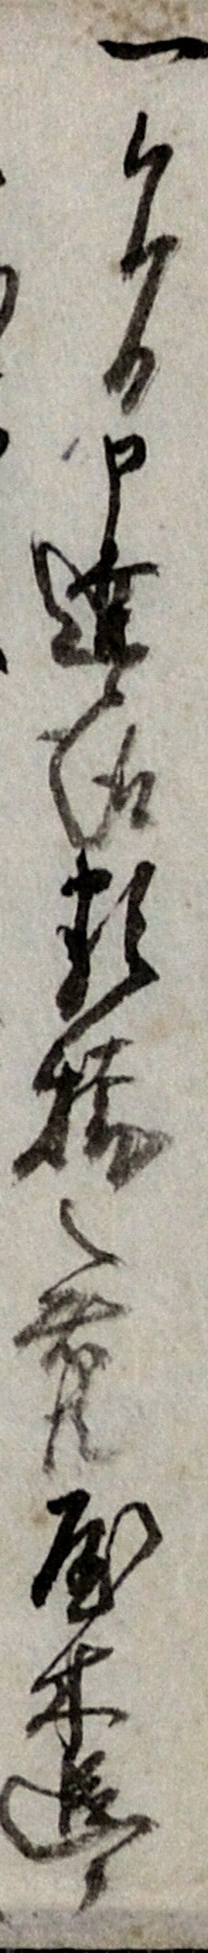一今日申達候趣類焼之者共屋木追々
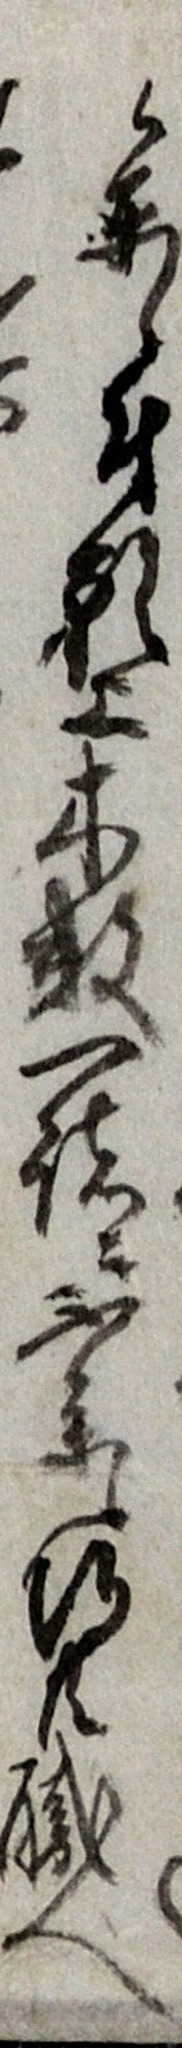参候付願上木数一緒に不参候得共職人
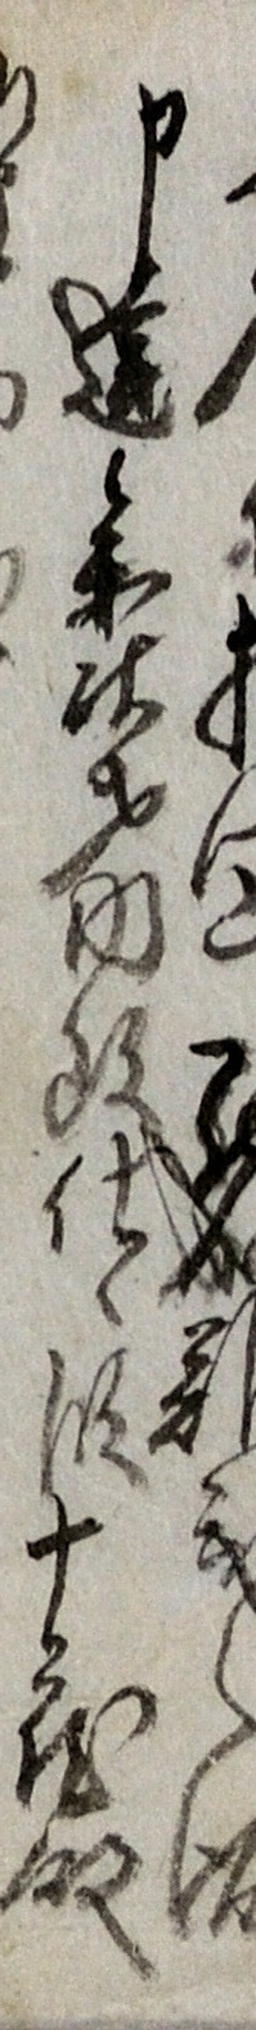申達参次第内改仕候段十蔵殿へ
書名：分一方諸事御用留帳
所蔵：伊那市立高遠町図書館・合同会社AMANE
